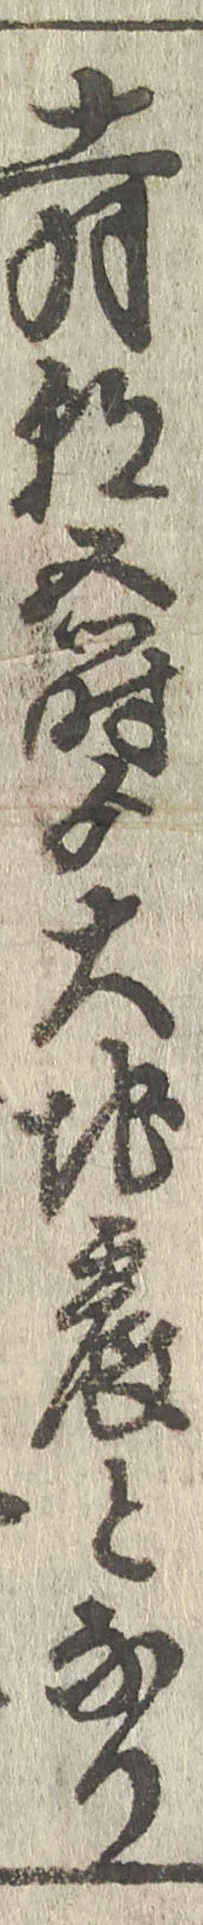十一月朝五ツ時ゟ大地震となり
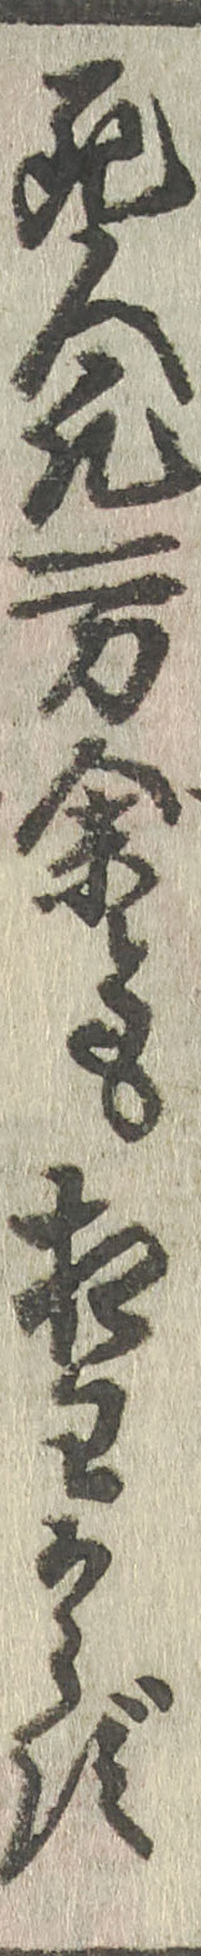死人凡一万余とも相わからず
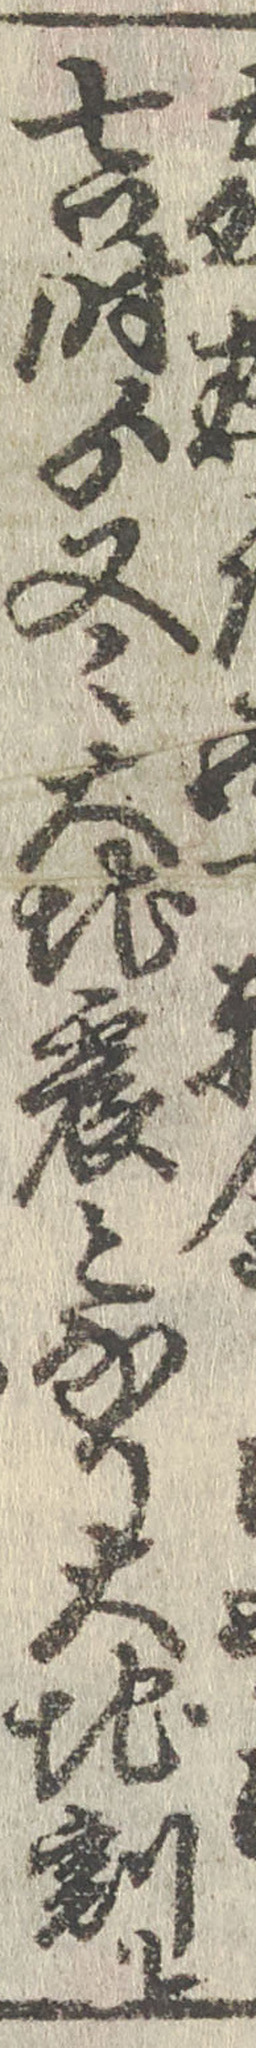七ツ時ゟ又々大地震となり大地割レ
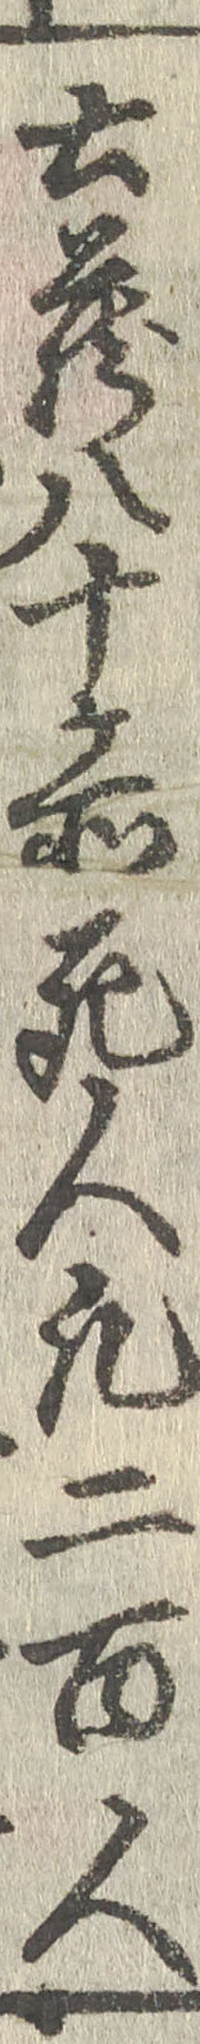土蔵八十ケ所死人凡二百人
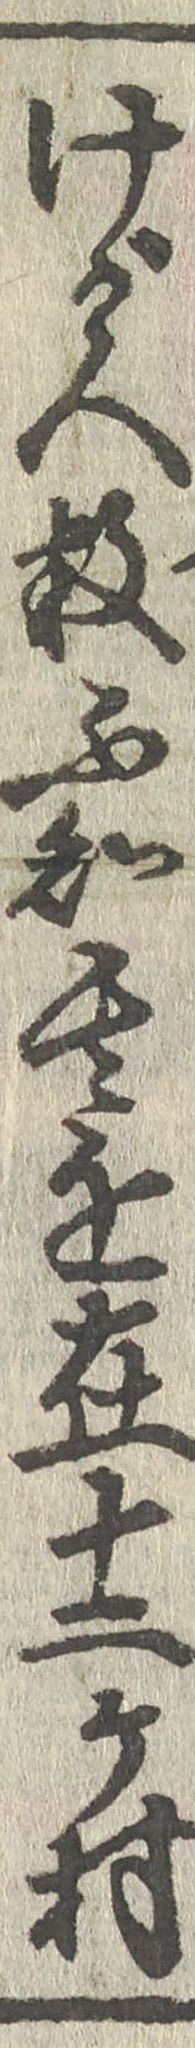けが人数不知其近在十二ケ村
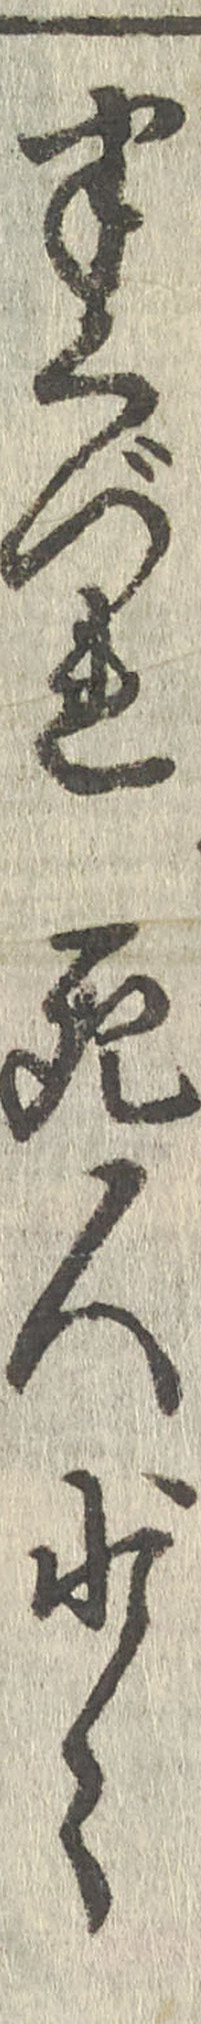半くづれ死人少々
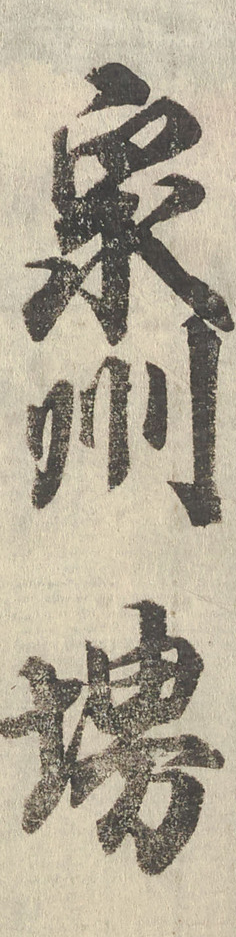泉州堺
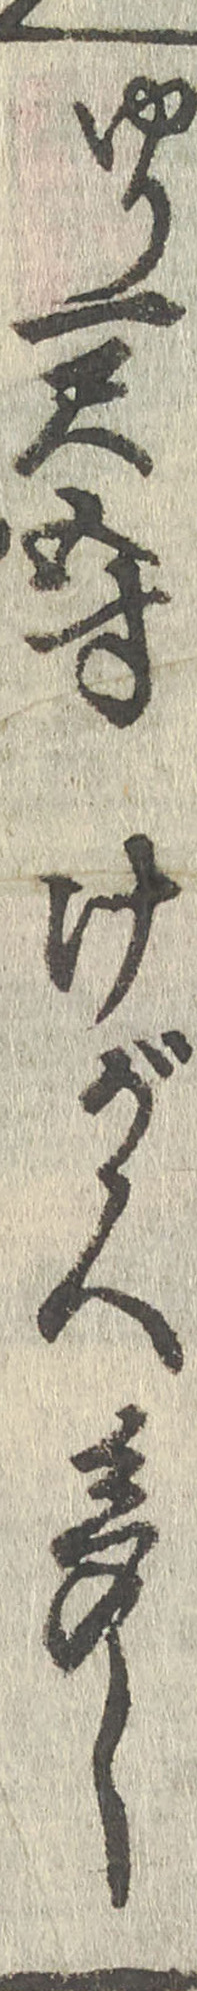ゆり一尺五寸けが人多し
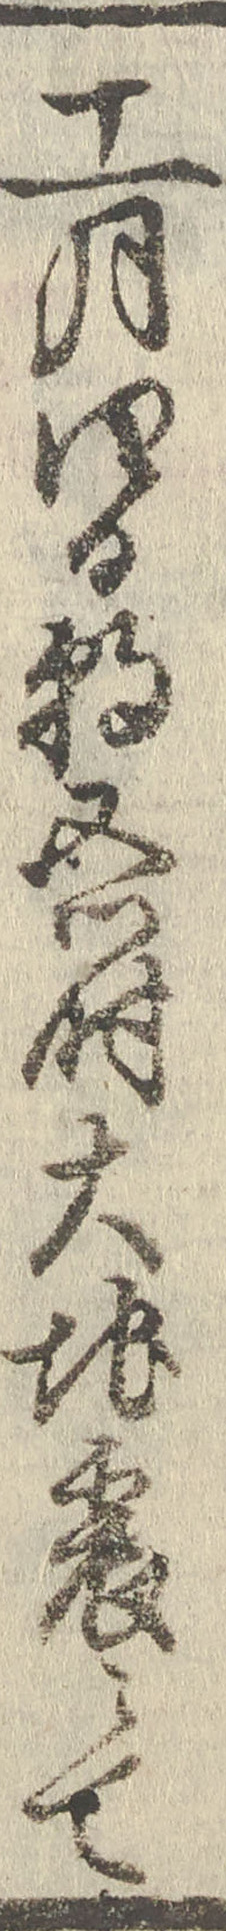十一月四日朝五ツ時大地震にて
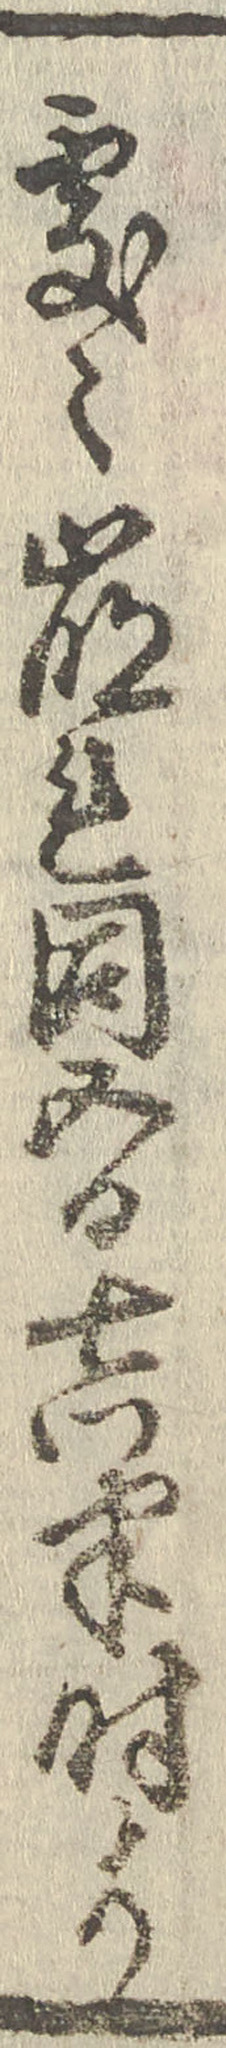処々崩れ同五日七ツ半時より
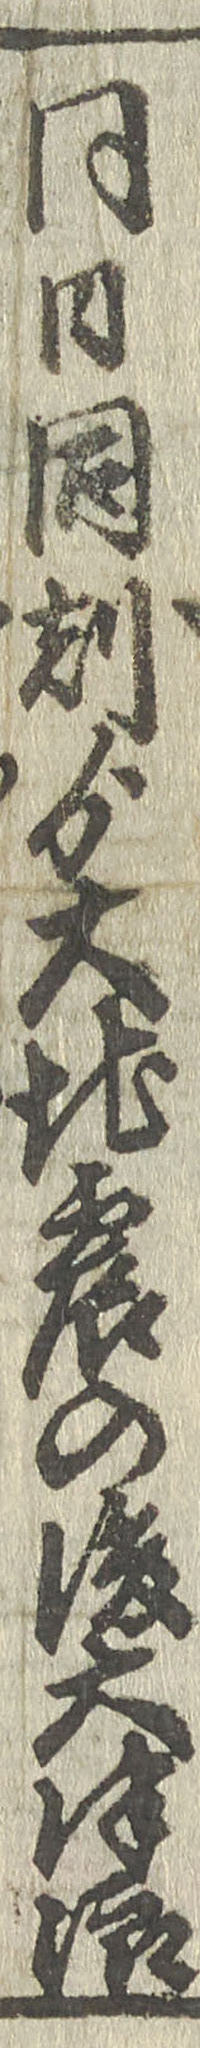同日同刻ゟ大地震の後大津浪
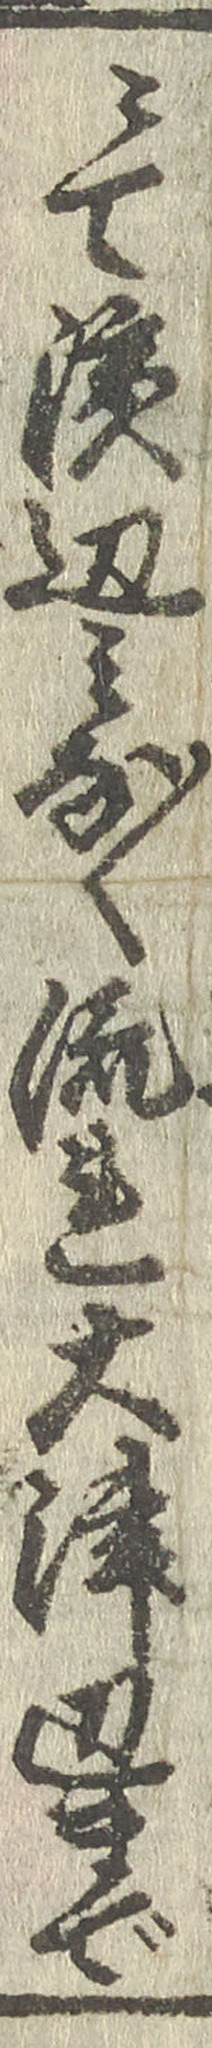にて浜辺みな〳〵流れ大津辺まで
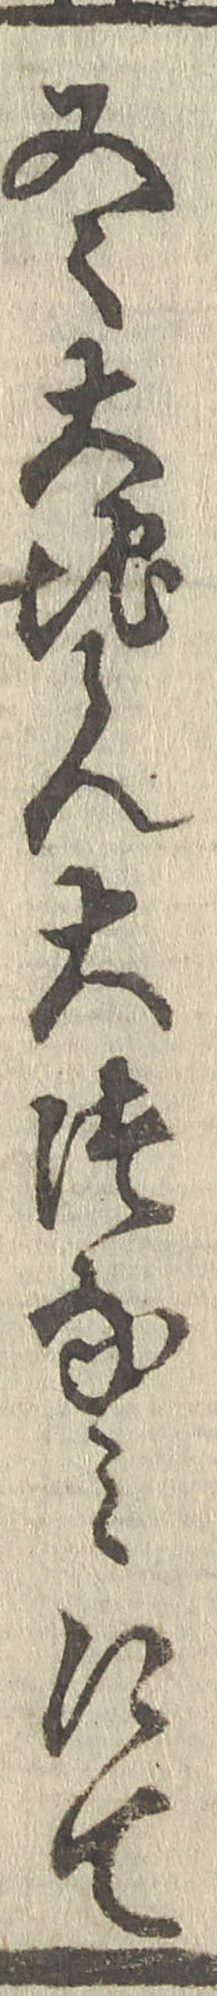又々大地しん大つなみにて
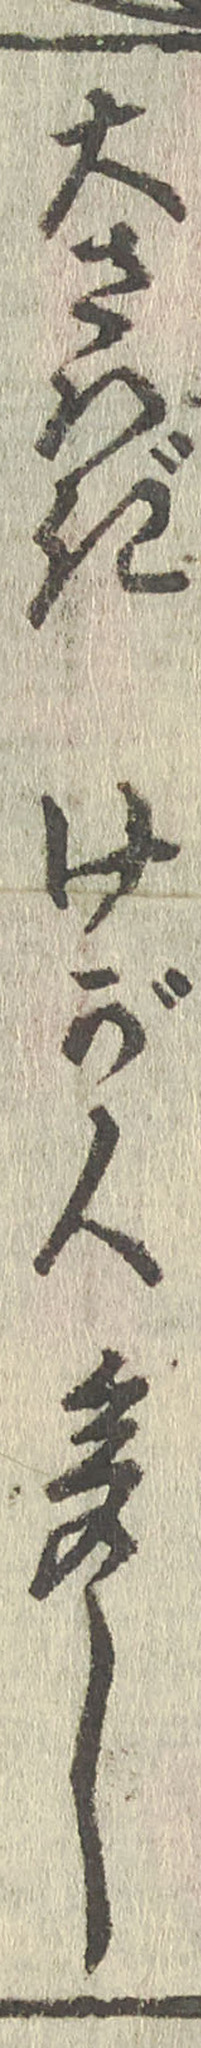大さはぎけが人多し
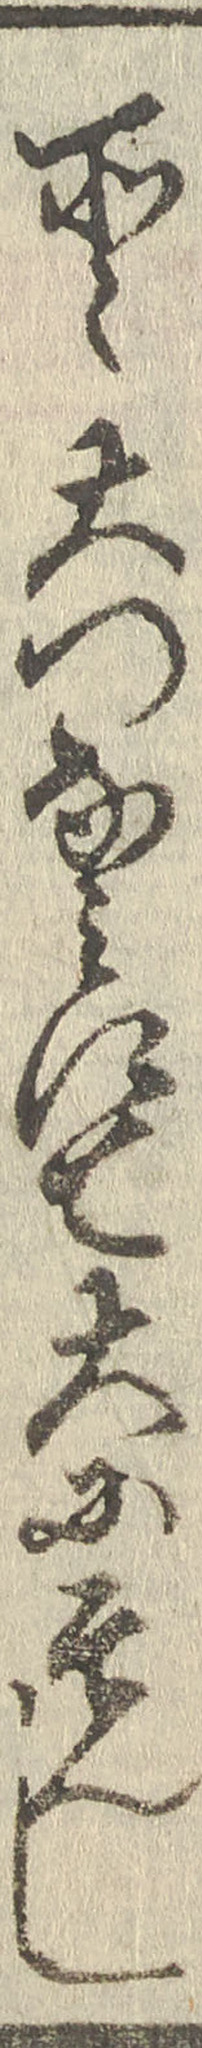所々大つなみにて大にそんし
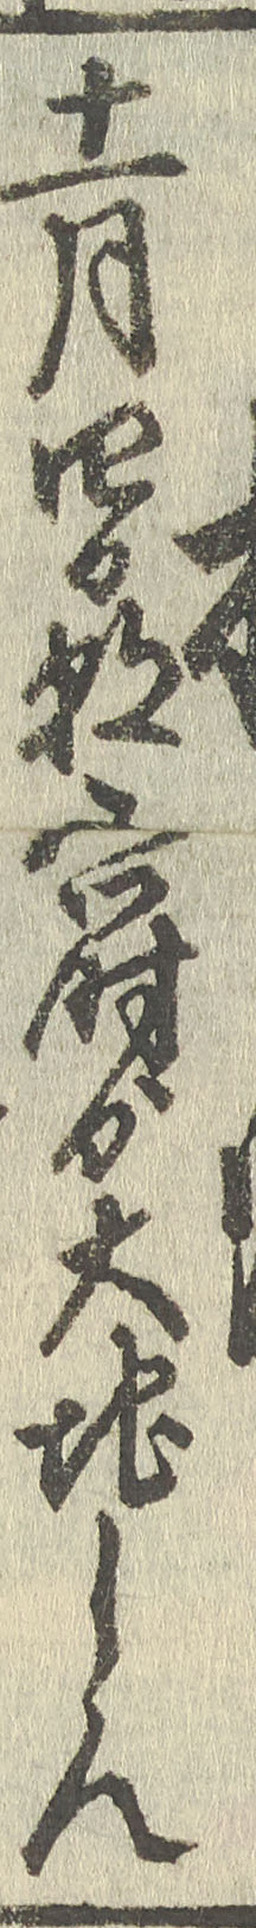十一月四日朝五ツ時ゟ大地しん
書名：聞書東海道南海道国々大地震大つなミ
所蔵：東京大学総合図書館 General Library in the University of Tokyo, JAPAN
